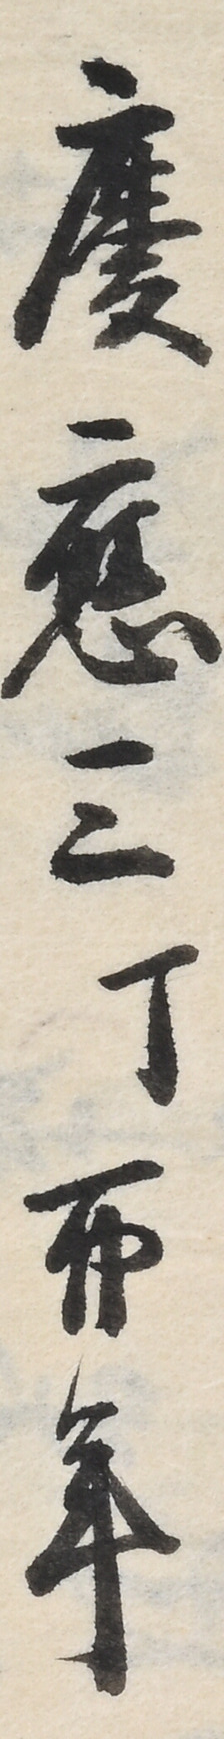慶応三丁卯年
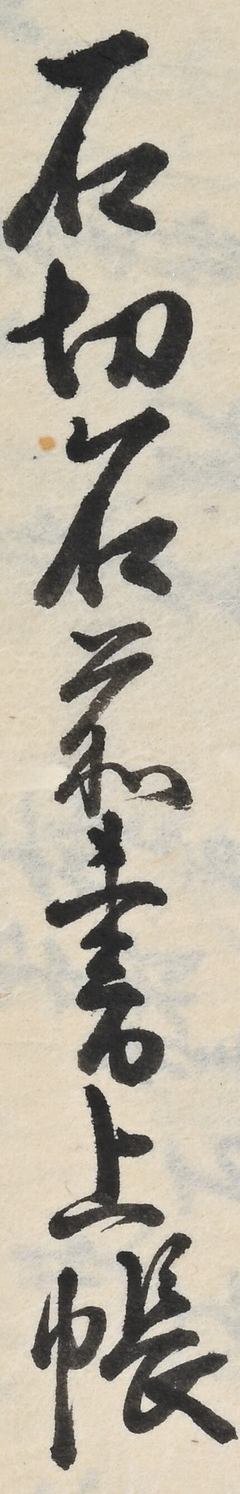石切名前書上帳
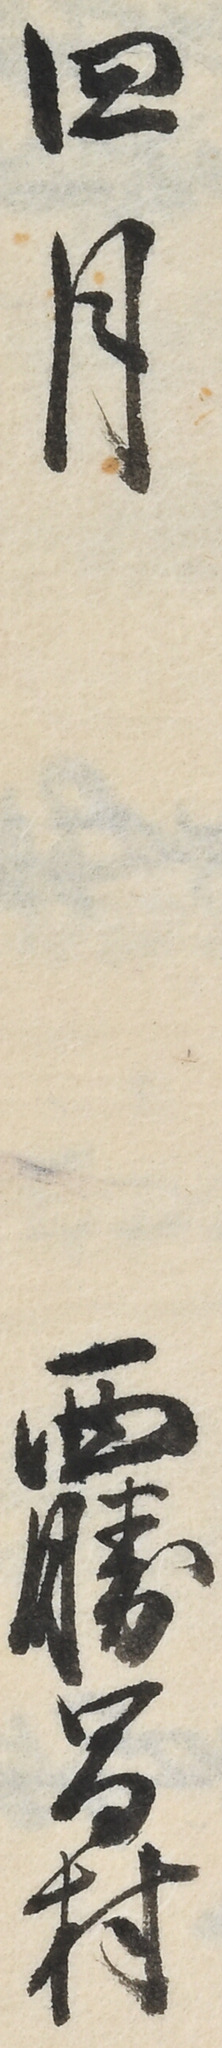四月西勝間村

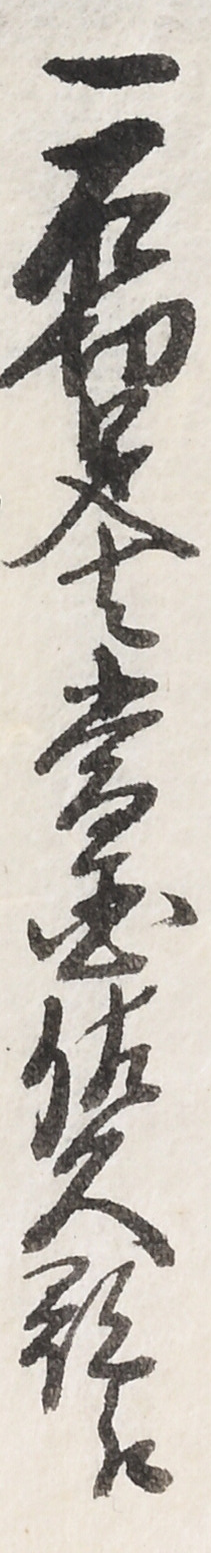一石切是者当国佐久郡江
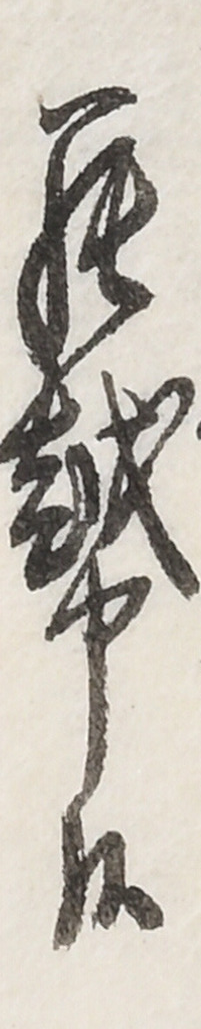罷越申候
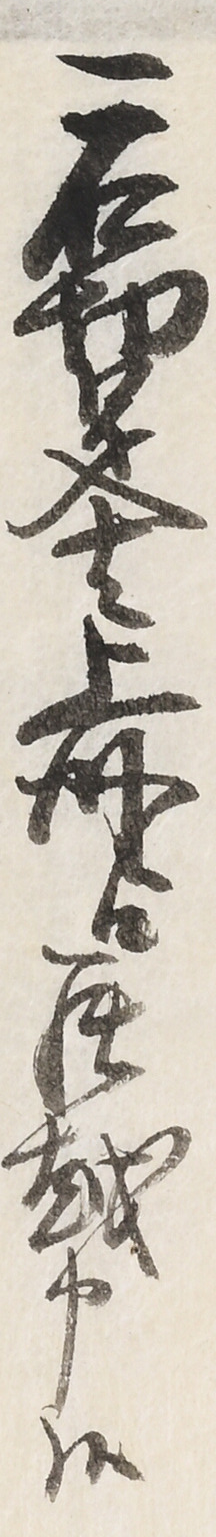一石切是者上州ゟ罷越申候
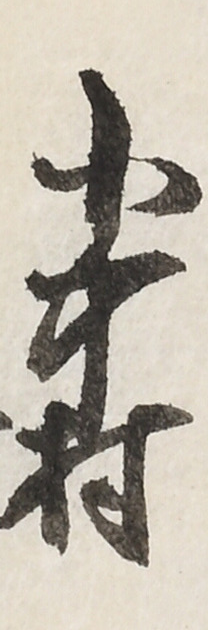小中村
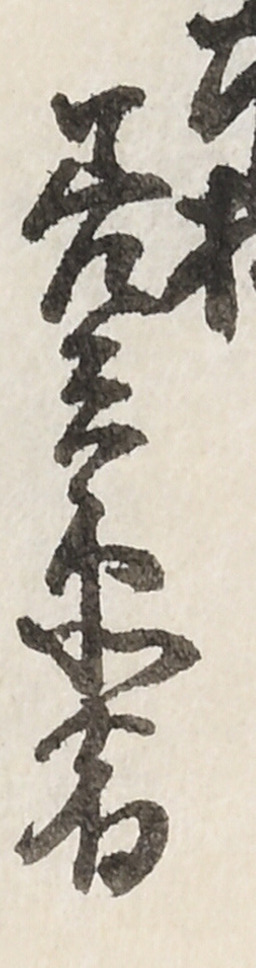善兵衛宿
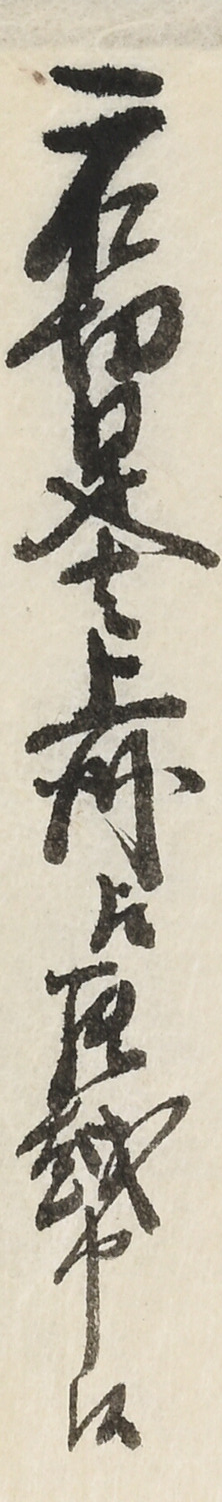一石切是者上州ゟ罷越申候
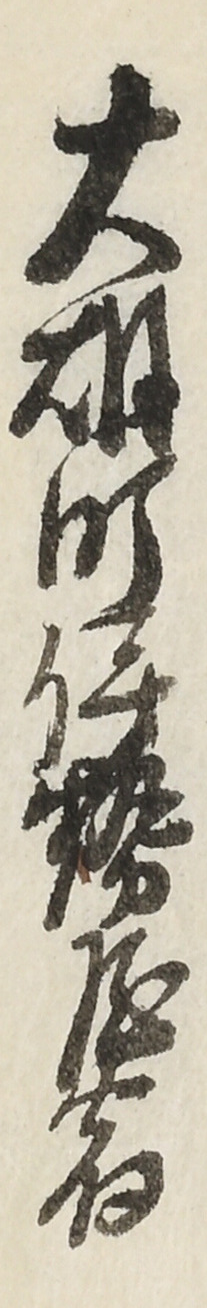大胡町伊勢屋宿
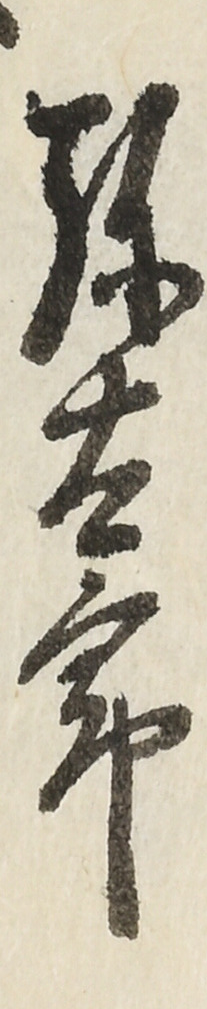弥太郎

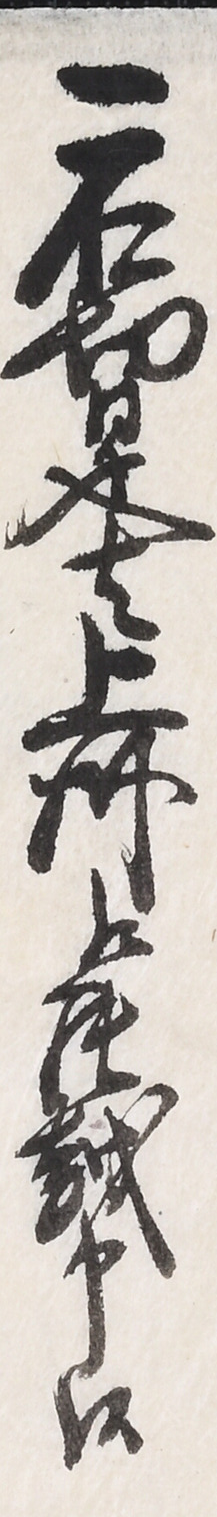一石切是者上州江罷越申候
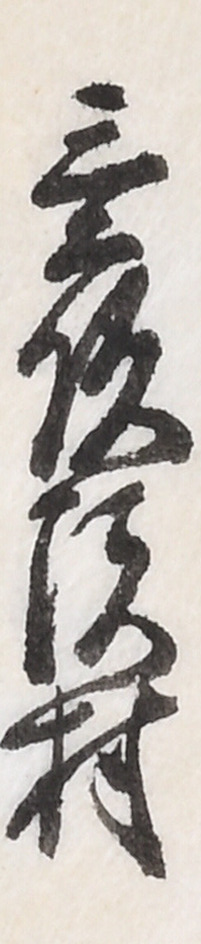三夜沢村
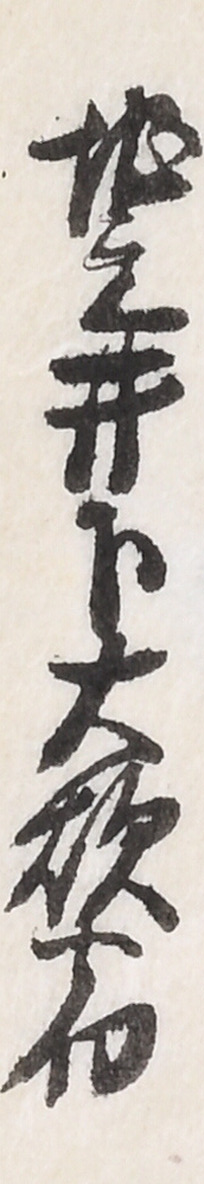地主井下大炊宿
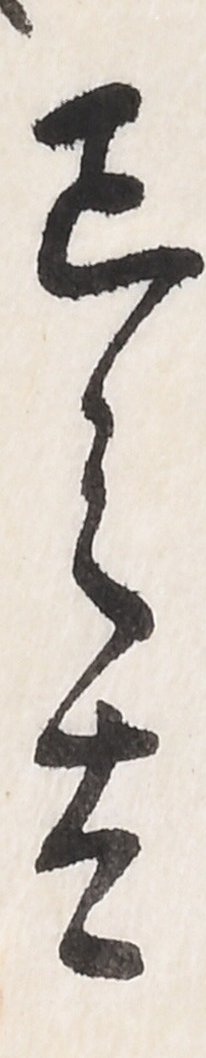巳之太
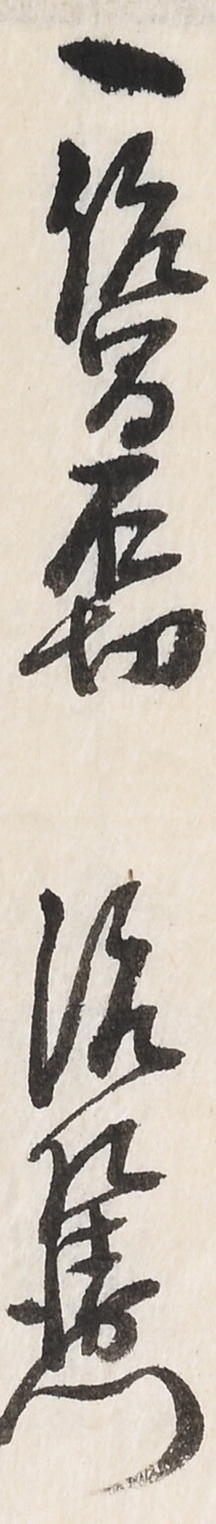一作間石切治左衛門
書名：慶應三丁卯年四月石切名前書上帳
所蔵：伊那市立高遠町図書館・合同会社AMANE
